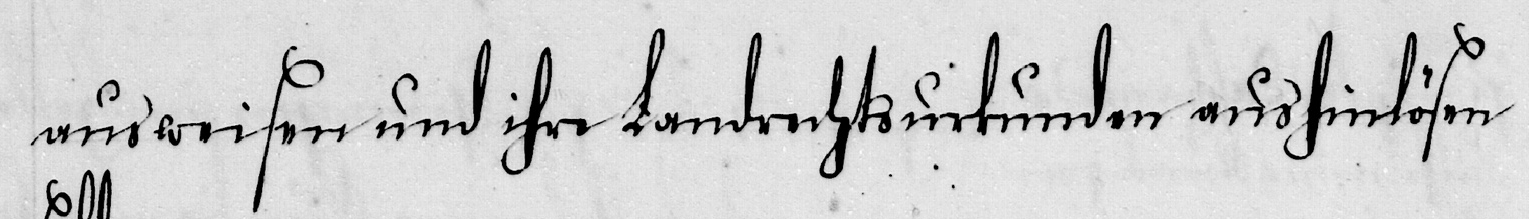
ausweisen und ihre Landrechtsurkunden aushinlösen
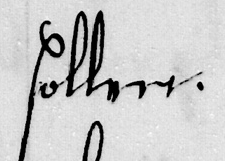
sollen.
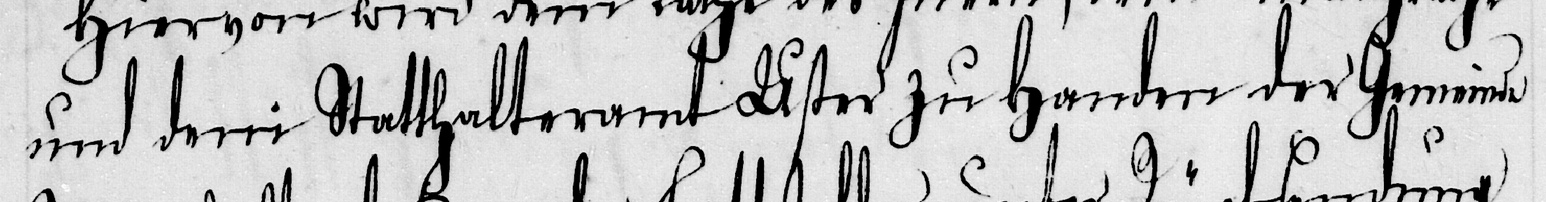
und dem Statthalteramt Uster zu Handen der Gemeinde
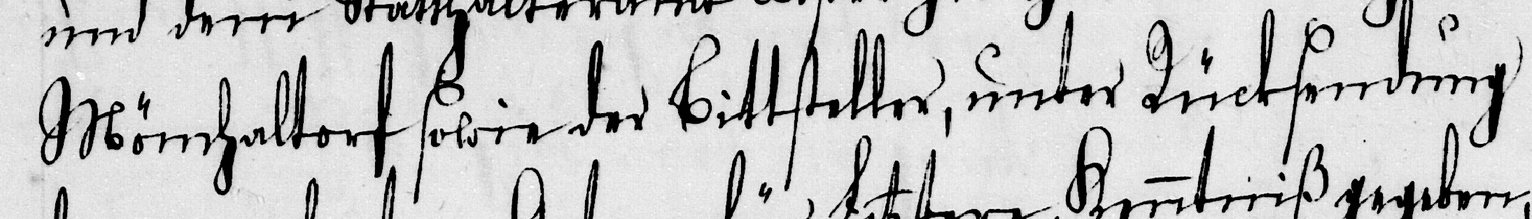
Mönchaltorf sowie der Bittsteller, unter Rücksendung
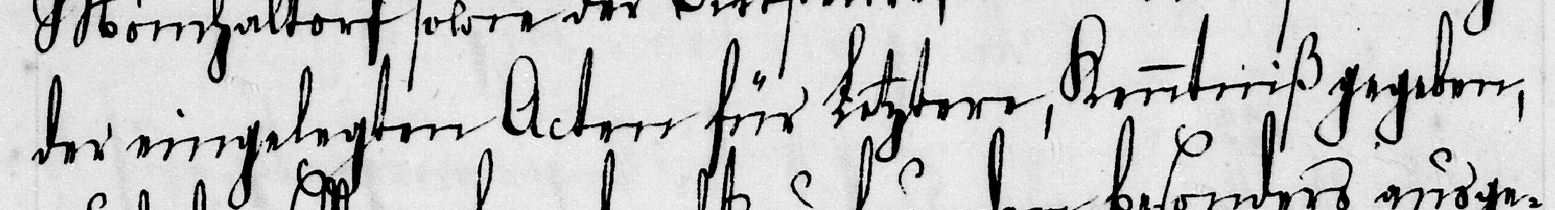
der eingelegten Acten für Letztere, Kenntniß gegeben,
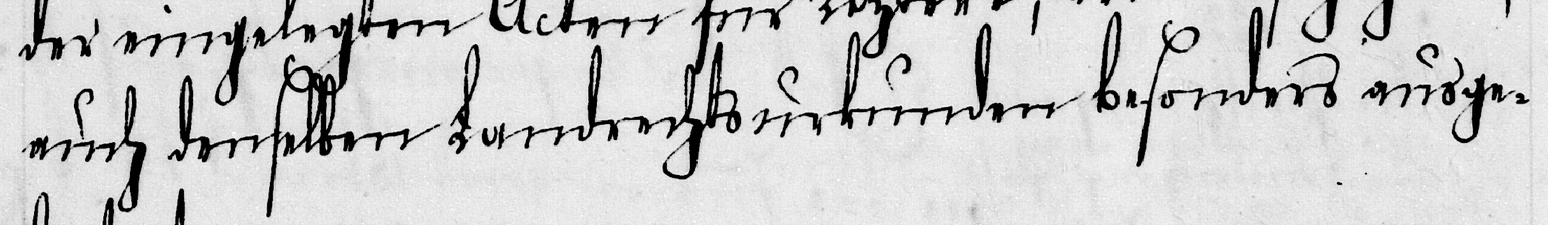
auch denselben Landrechtsurkunden besonders ausge¬
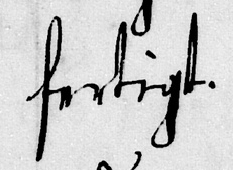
fertigt.
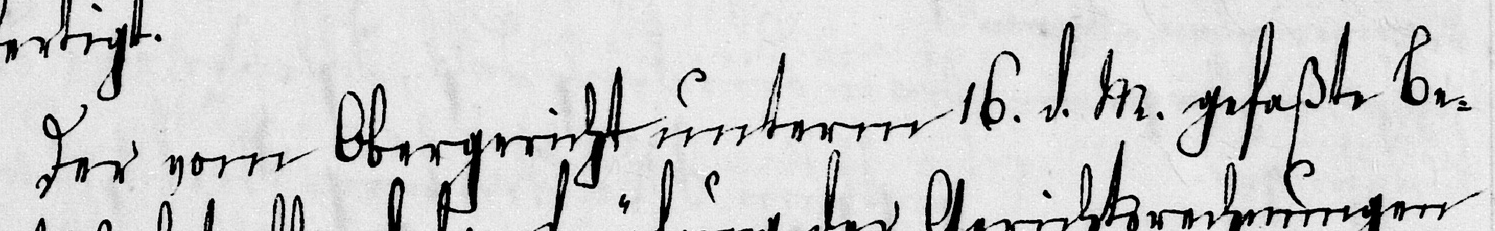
Der vom Obergericht unterm 16. d. M. gefaßte Be¬
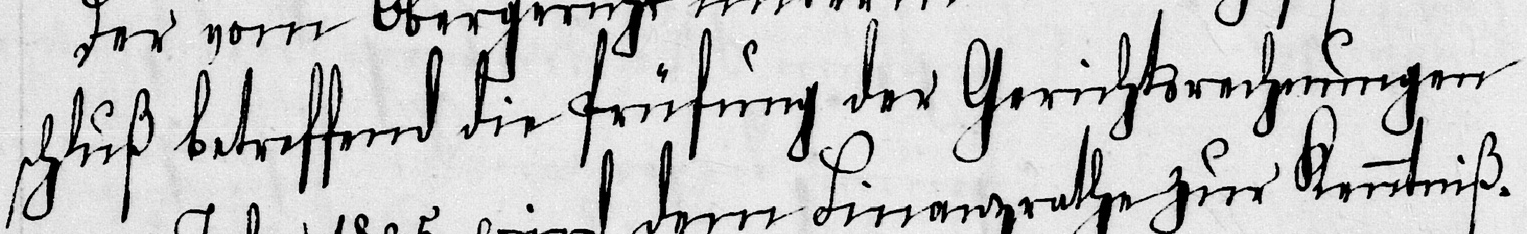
schluß betreffend die Prüfung der Gerichtsrechnungen
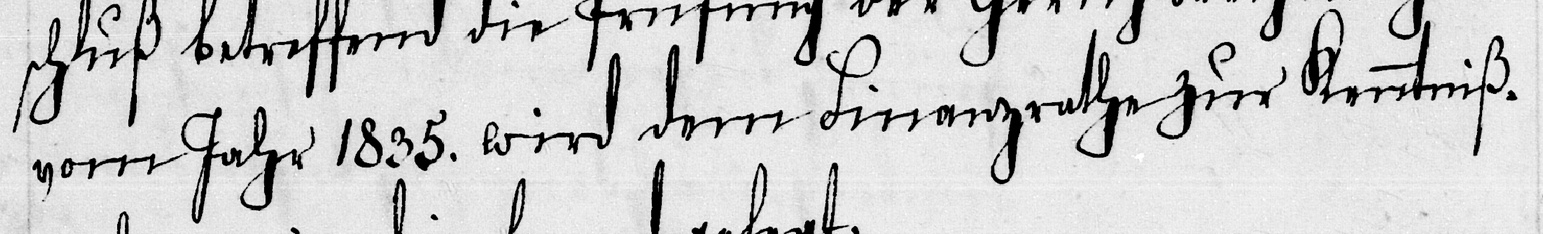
vom Jahr 1835. wird dem Finanzrathe zur Kenntniß¬
